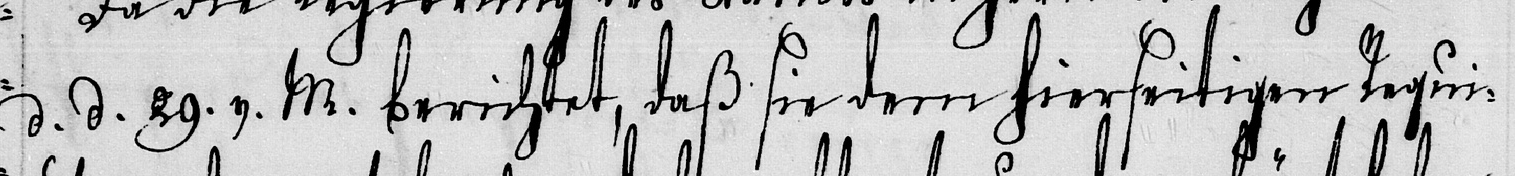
d. d. 29. v. M. berichtet, daß sie dem hierseitigen Requi¬
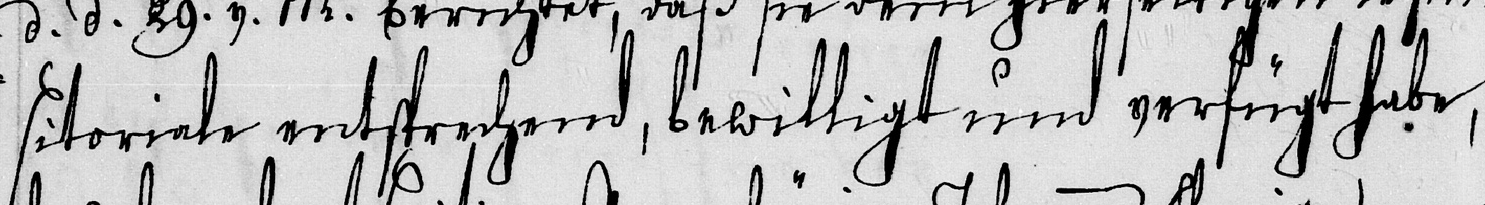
sitoriale entsprechend, bewilligt und verfügt habe,
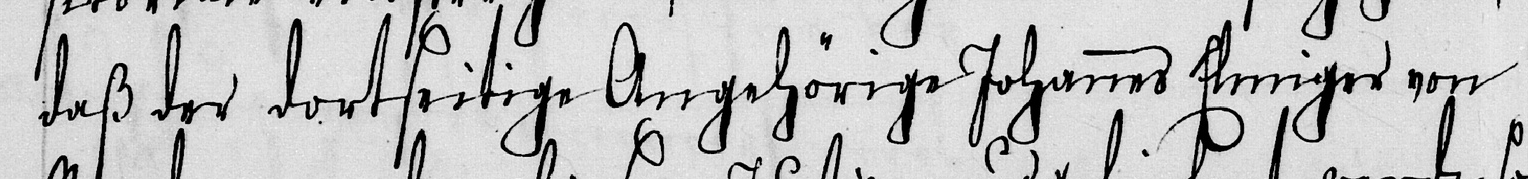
daß der dortseitige Angehörige Johannes Elmiger von
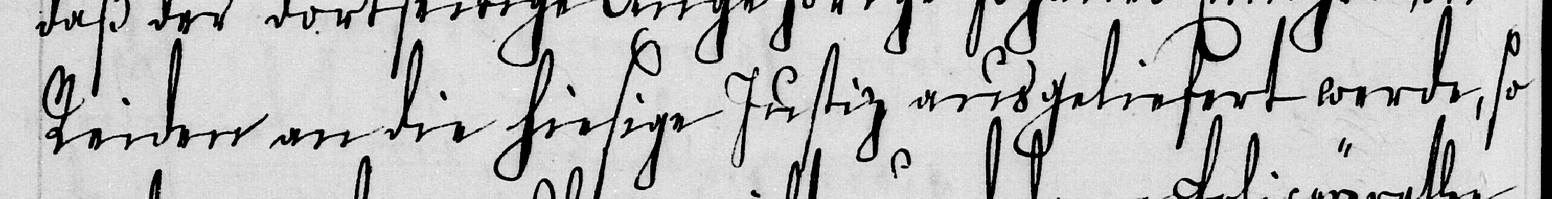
Reiden an die hiesige Justiz ausgeliefert werde, so
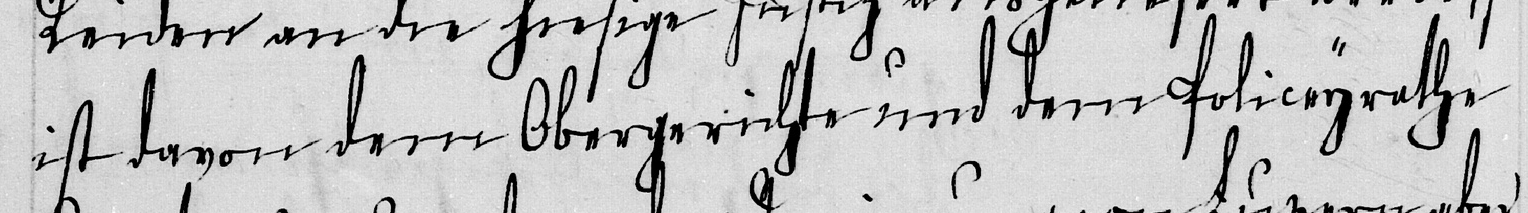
ist davon dem Obergerichte und dem Policeyrathe
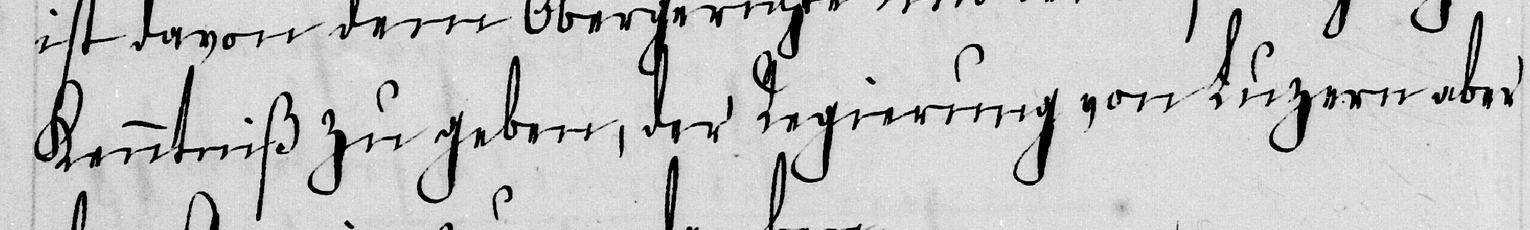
Kenntniß zu geben, der Regierung von Luzern aber
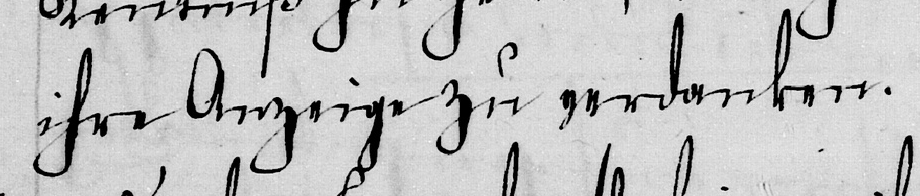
ihre Anzeige zu verdanken.
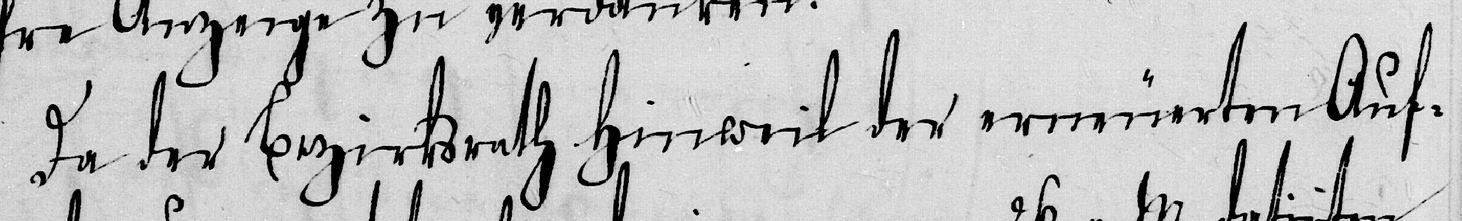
Da der Bezirksrath Hinweil der erneuerten Auf¬
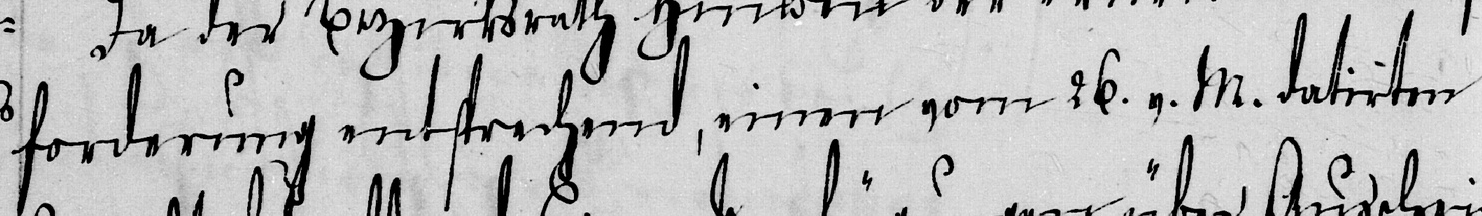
forderung entsprechend, einen vom 26. v. M. datirten
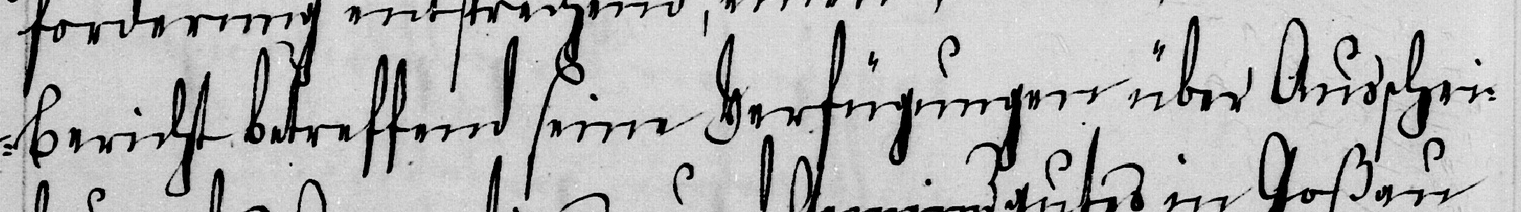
Bericht betreffend seine Verfügungen über Ausschei¬
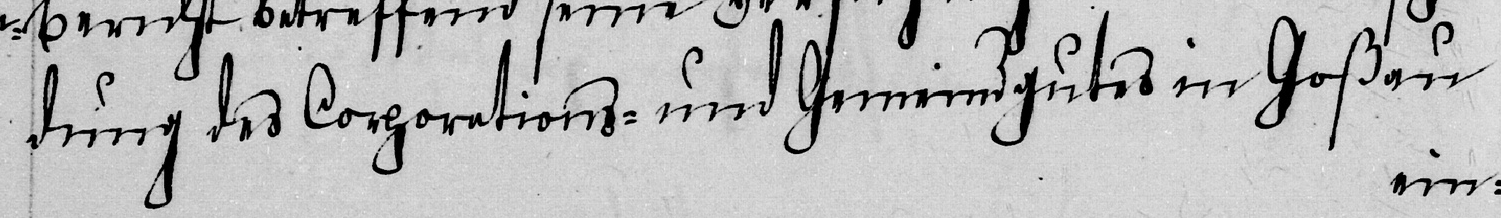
dung des Corporations- und Gemeindgutes in Goßau
